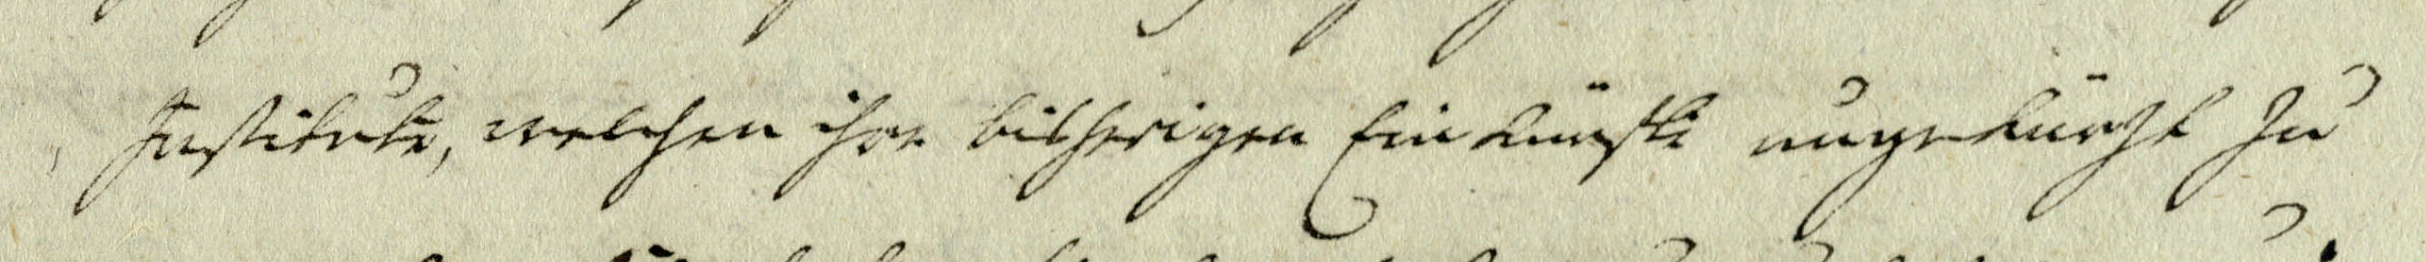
Institute, welchen ihre bisherigen Einkünfte ungekürzt zu
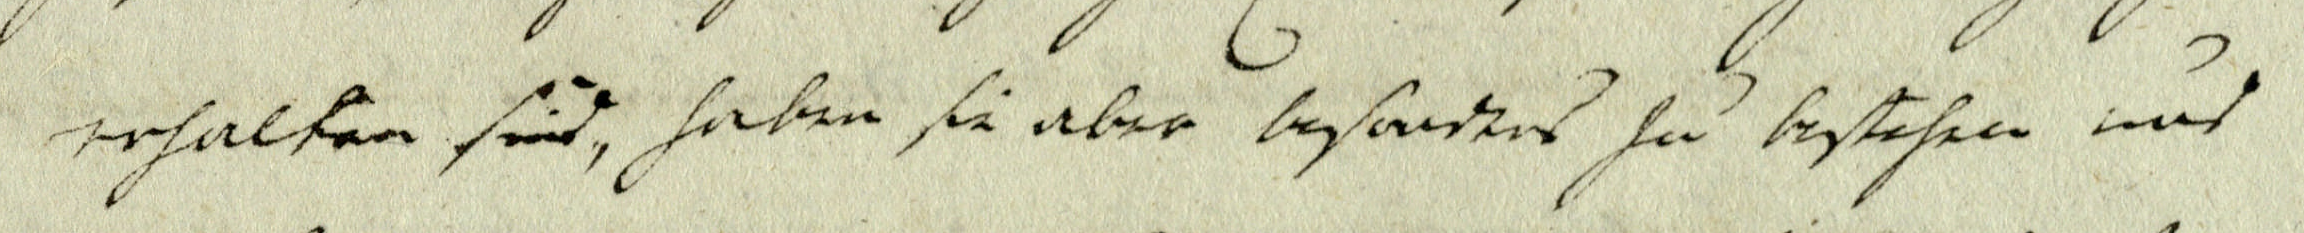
erhalten sind, haben sie aber besonders zu bestehen und
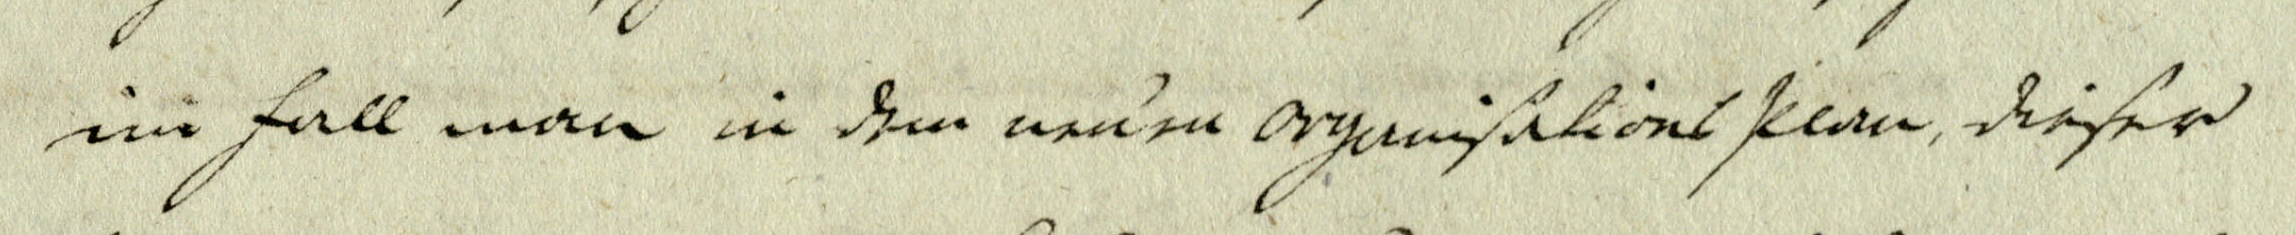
im Fall man in dem neuen Organisations Plan, dieser
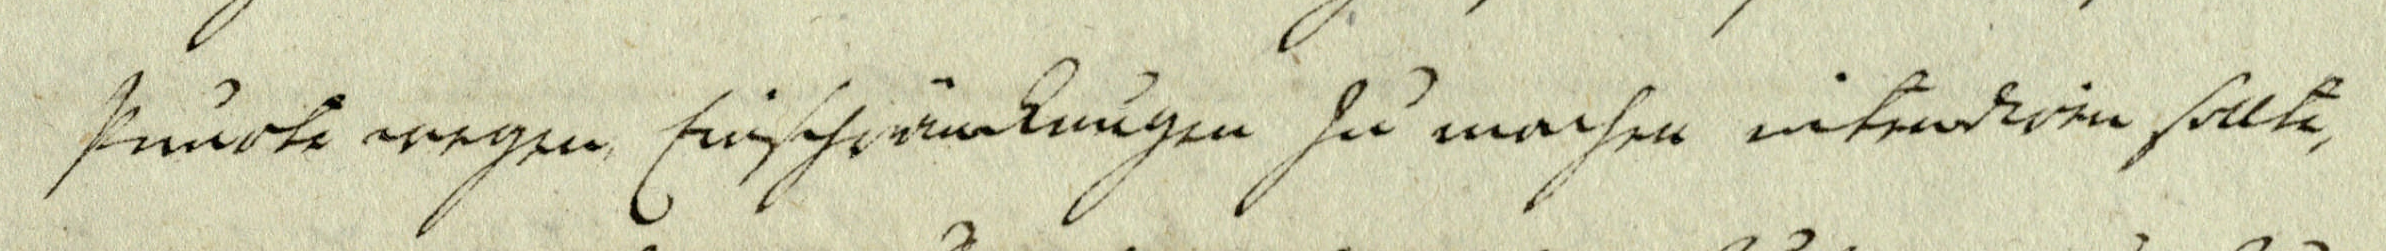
Puncte wegen Einschränkungen zu machen intendiren sollte,
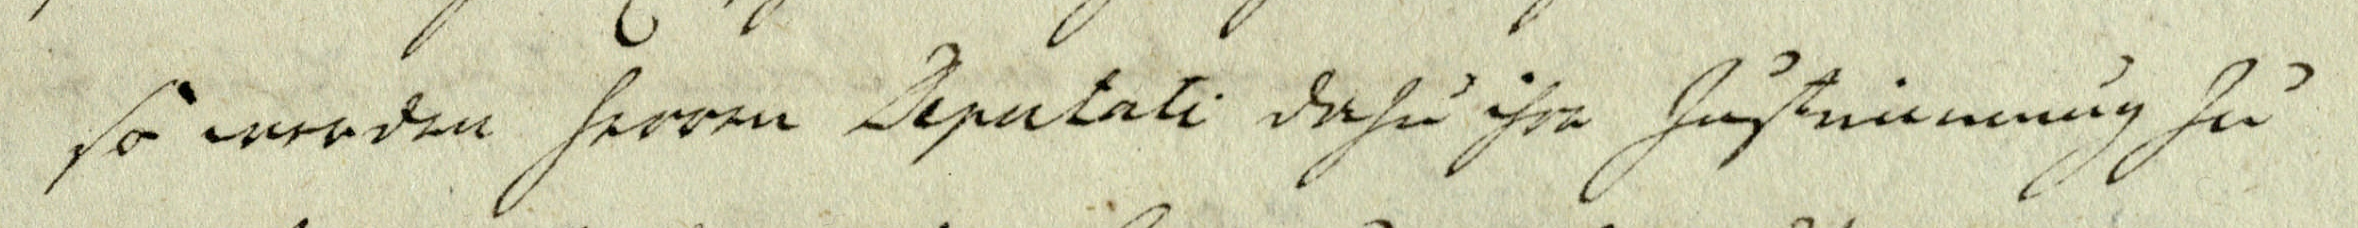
so werden Herren Deputati dazu ihre Zustimmung zu
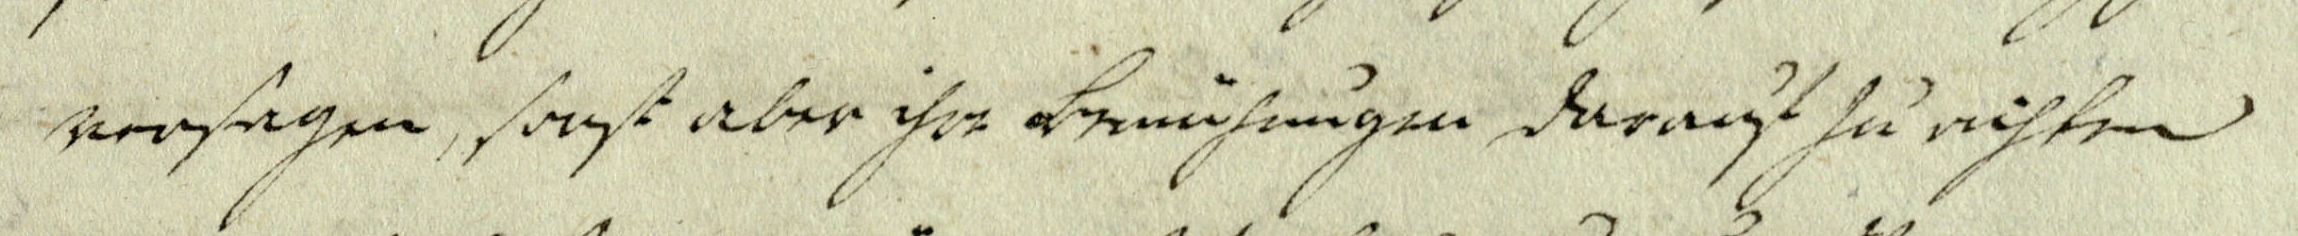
versagen, sonst aber ihre Bemühungen darauf zu richten
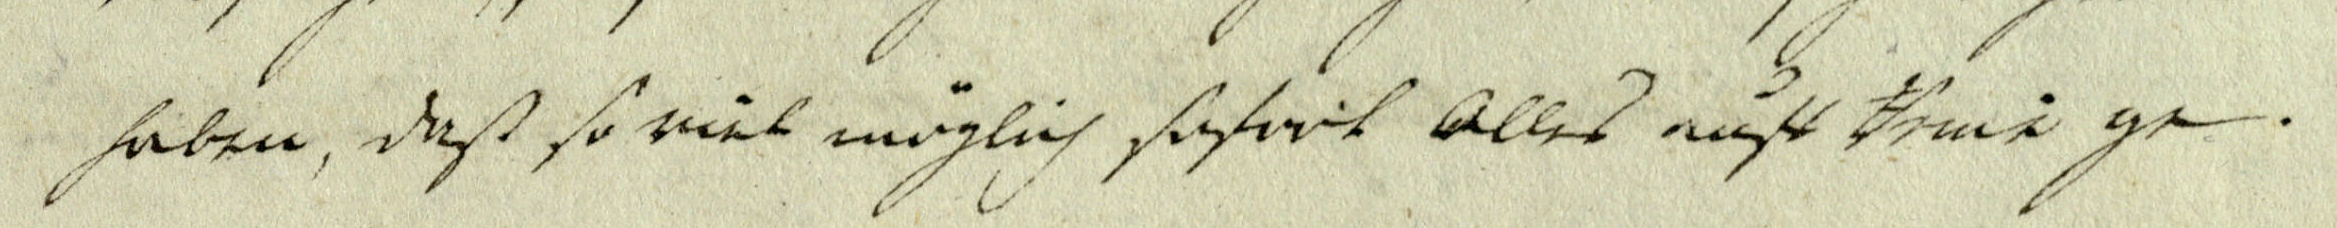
haben, daß so viel möglich sofort Alles aufs Reine ge¬
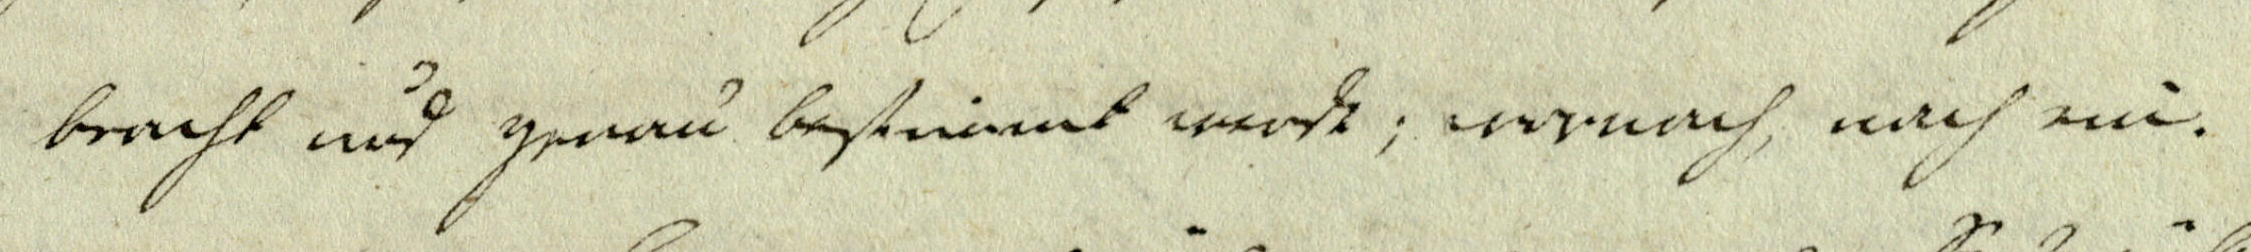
bracht und genau bestimmt werde; wornach, nach ein¬
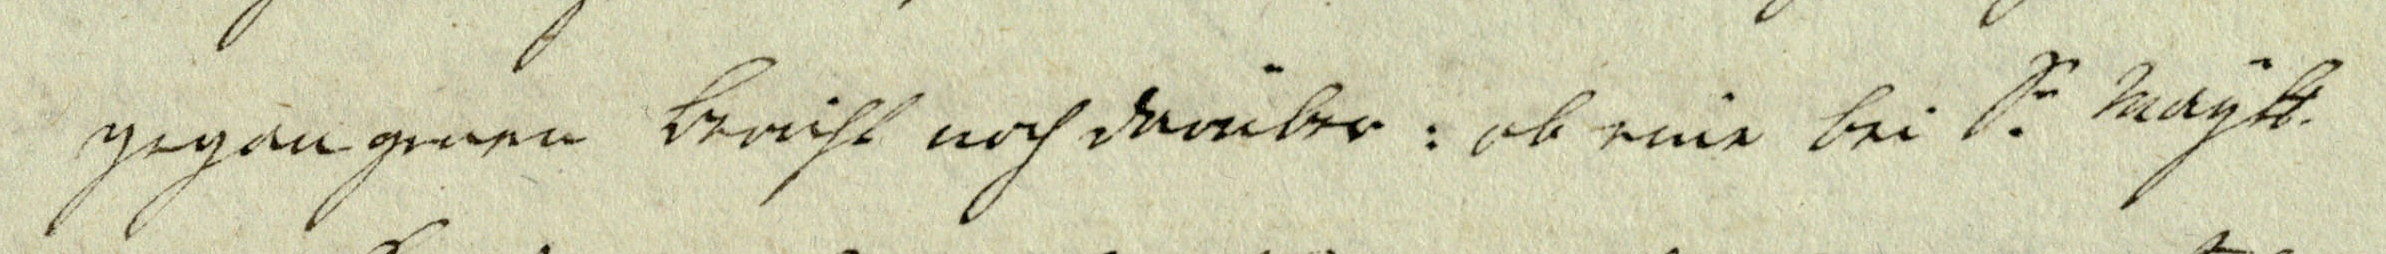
gegangenen Bericht noch darüber: ob eine bei Sr Maÿtt.
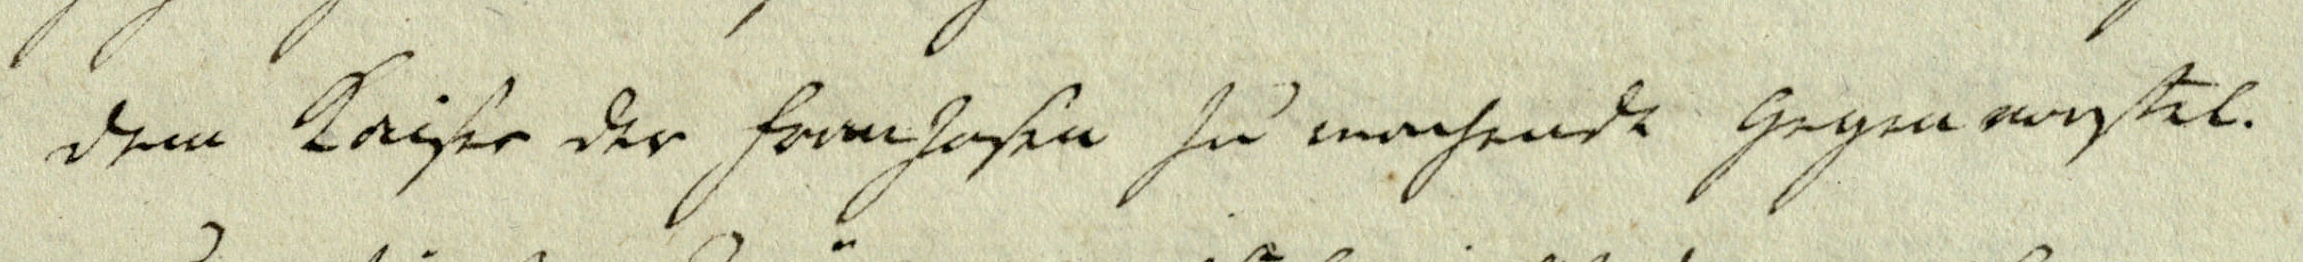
dem Kaiser der Franzosen zu machende Gegenvorstel¬
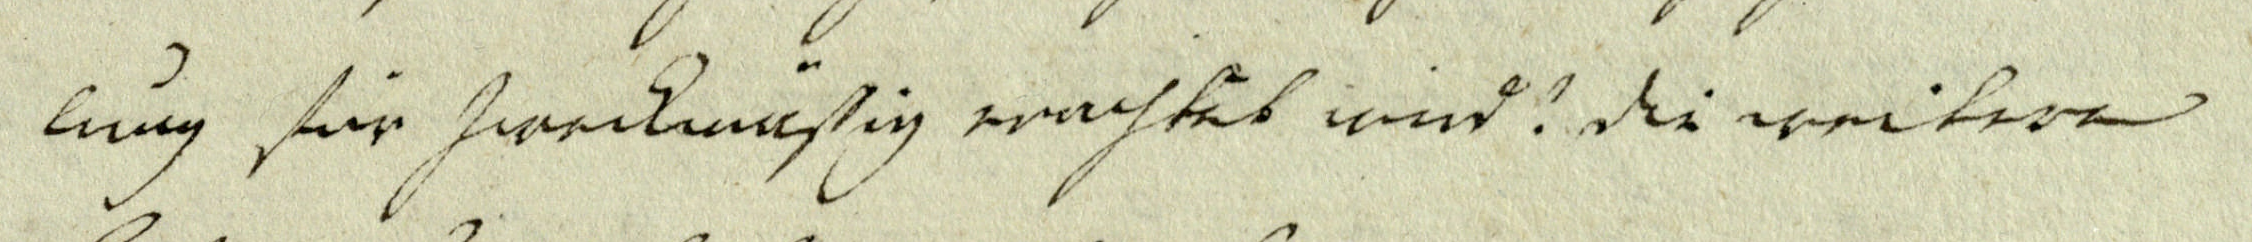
lung für zweckmässig erachtet wird? die weitere
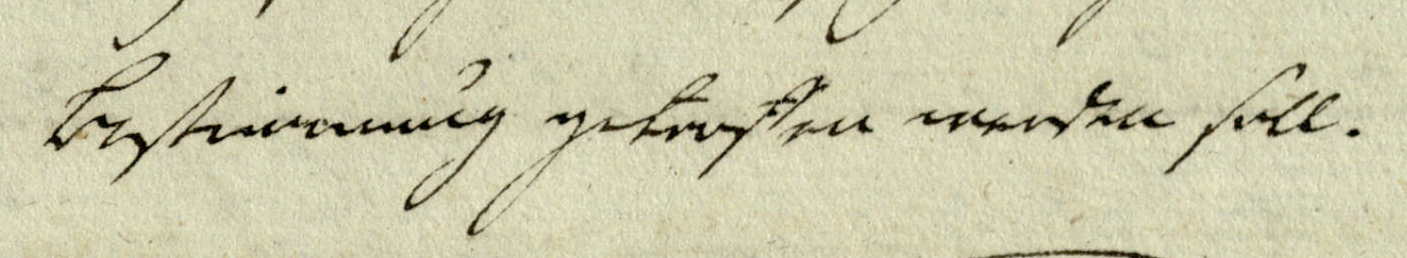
Bestimmung getroffen werden soll.
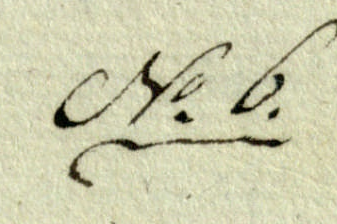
Nº 6.
